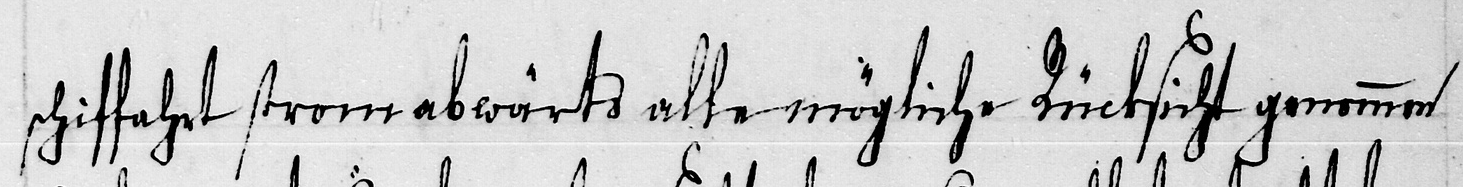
chiffahrt stromabwärts alle mögliche Rücksicht genommen
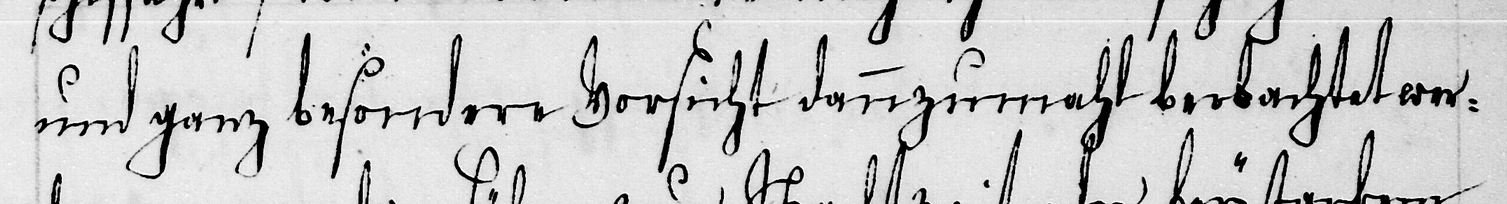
und ganz besondere Vorsicht dannzumahl beobachtet wer¬
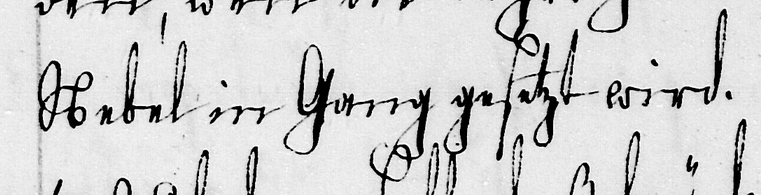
Nebel in Gang gesetzt wird.
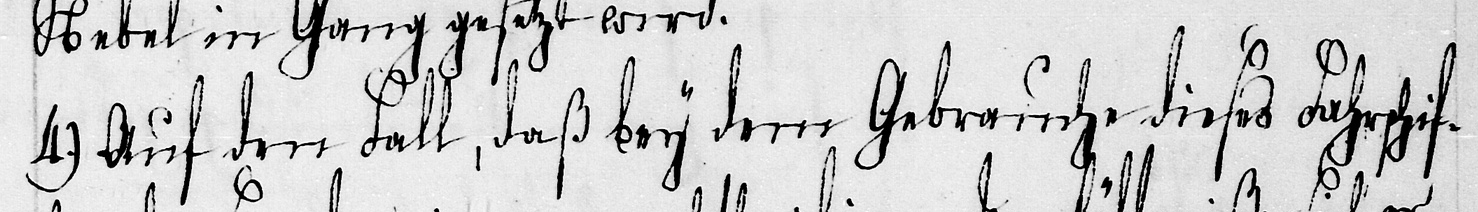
4.) Auf den Fall, daß bey dem Gebrauche dieses Fahrsch¬
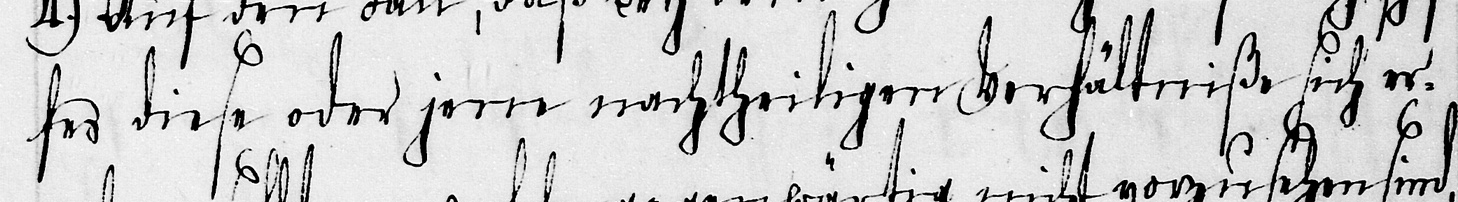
fes diese oder jene nachtheiligen Verhältniße sich er¬
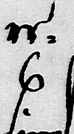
6.)
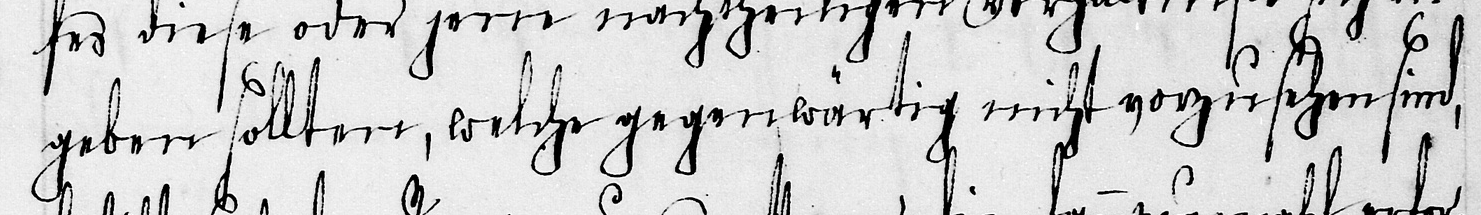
geben sollten, welche gegenwärtig nicht vorzusehen sind,
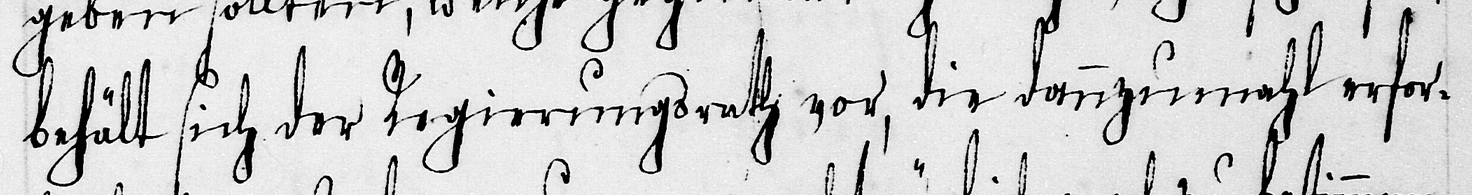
behält sich der Regierungsrath vor, die dannzumahl erfor¬
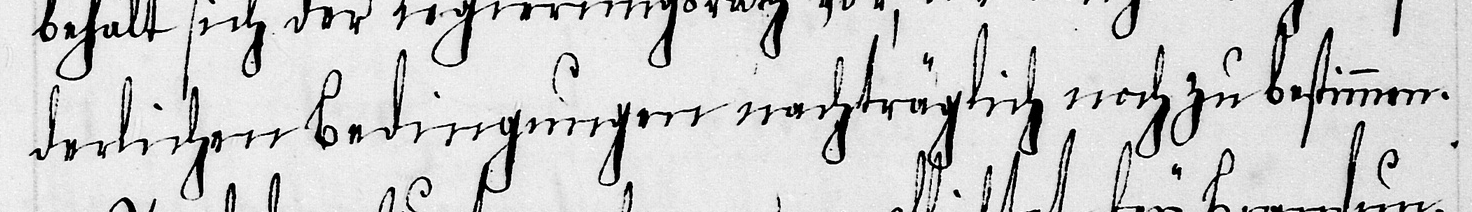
derlichen Bedingungen nachträglich noch zu bestimme¬
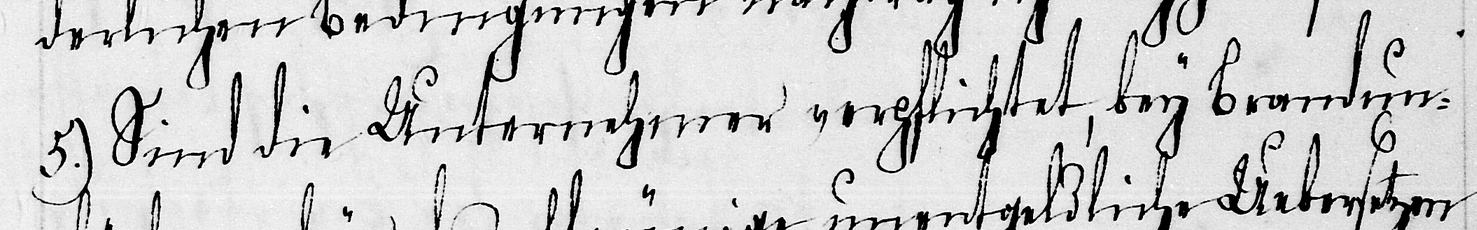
5.) Sind die Unternehmer verpflichtet, bey Brandun¬
